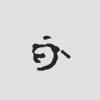可
